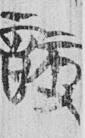○（辨）
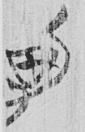男
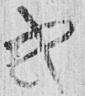女
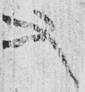又（有）
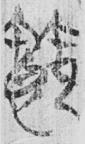節
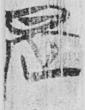是
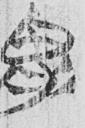{胃刀}（謂）
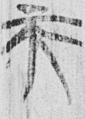天
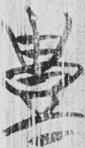豊（禮）
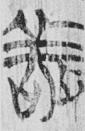敬敬
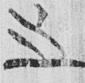之之
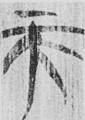天
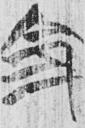命
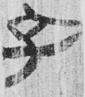孔
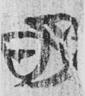明
